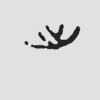出
